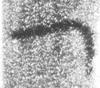一
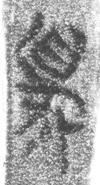臭
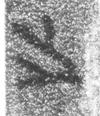之
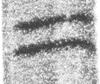二
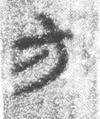方
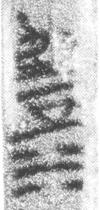監（鑒）
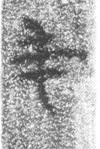屯
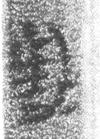彫（雕）
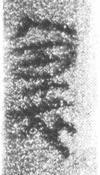裏
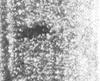一
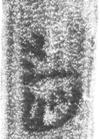齒
